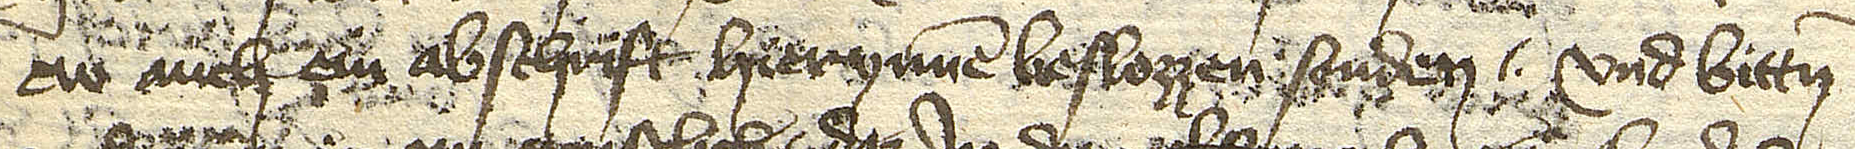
ew auch ein abſchrift hierynne* beſloʒʒen ſenden / . vnd bittn*
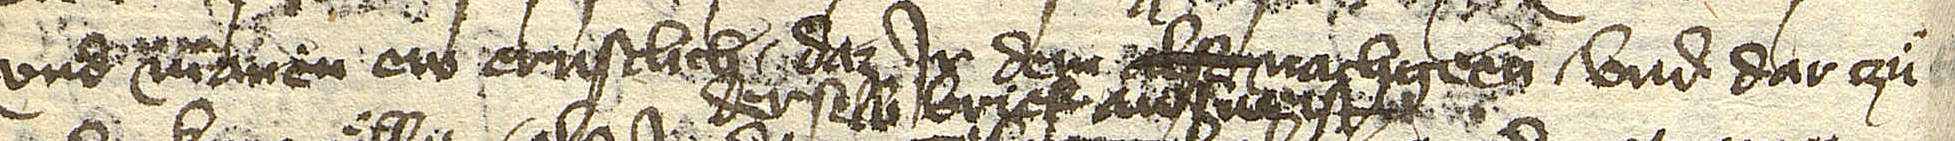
vnd manen ew ernſtlich / daʒ Ir dem alſo nachgeen / vnd dar cʒü
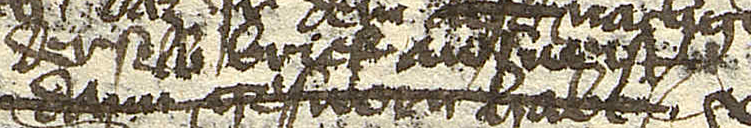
derſelb brief awſweiſt
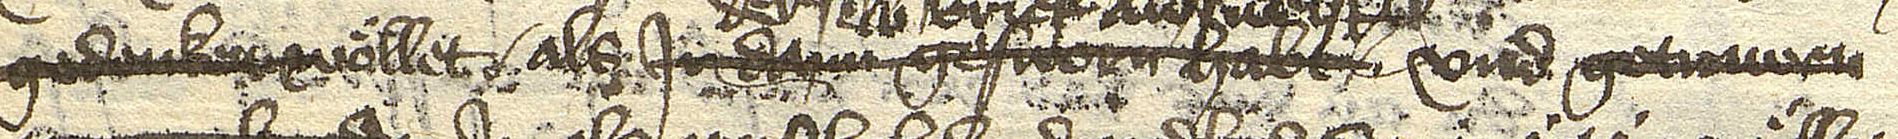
gedenken wöllet / als Ir dann geſworn habt / . vnd getrawen
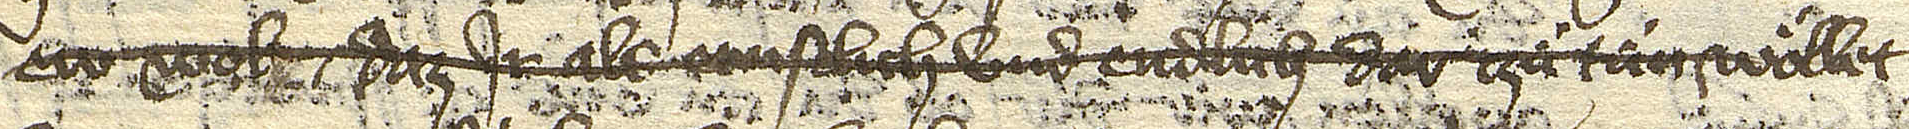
ew wol / daʒ Ir als ernstlich vnd endlich dar cʒü tün wöllet
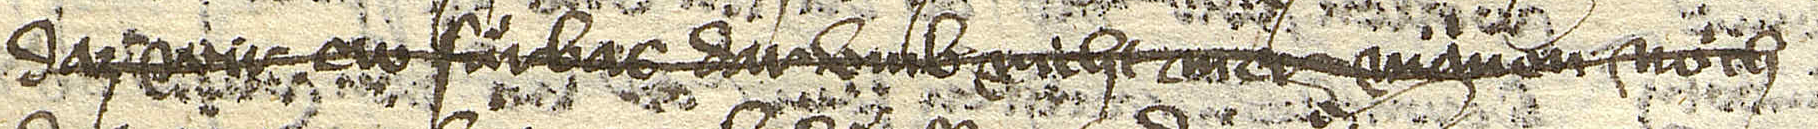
daʒ wir ew fürbas darvmb nicht mer manen noch
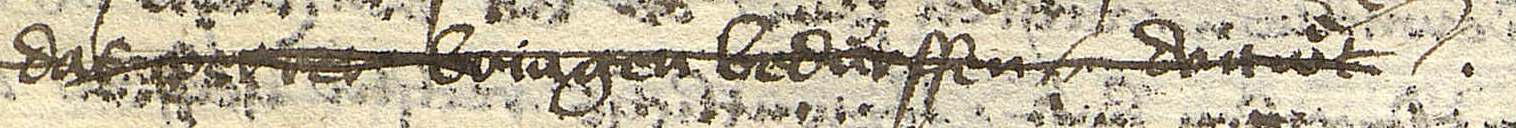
das verrer bringen bedürffen / Antw*t / .
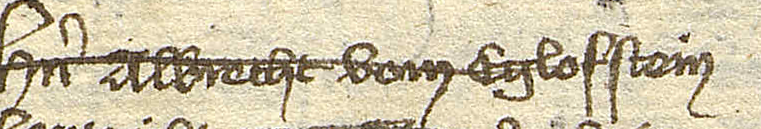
hn* Albrecht vom Eglofſtein
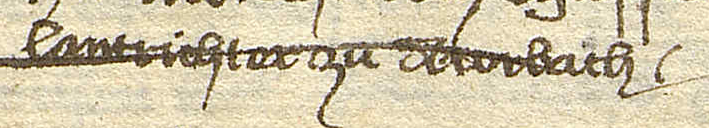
lantrichter cʒu Awrbach /
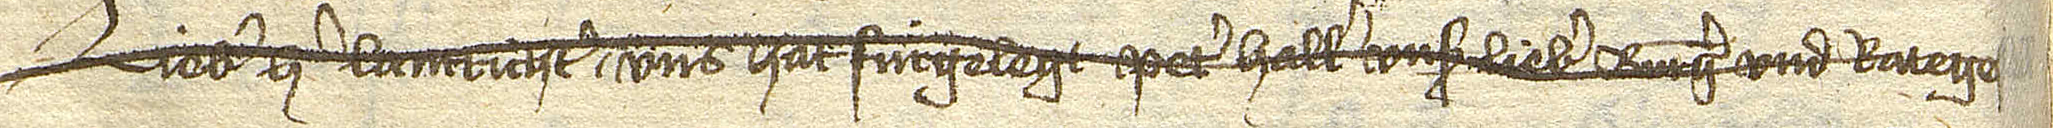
Lieb* h* lantricht* / vns hat fürgelegt pet* hall* vnſ* lieb* Burg* vnd Rategeſell
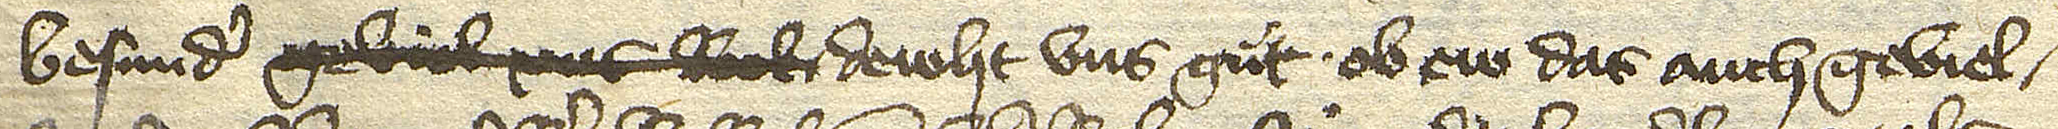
beſund* geviel vns wol / dewht vns güt . ob ew das auch geviel /
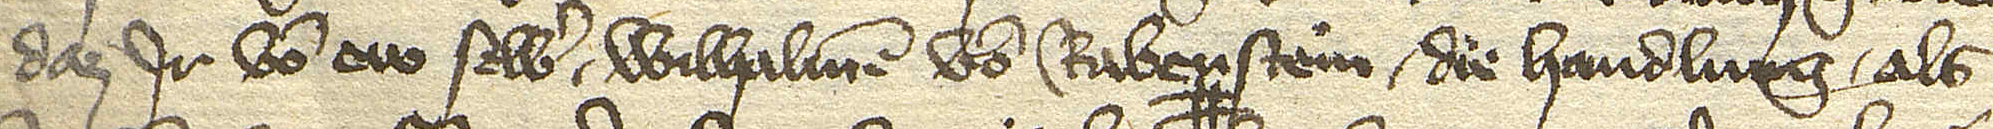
daʒ Ir vo* ew ſelb* / Wilhalme* vo* Rabenſtein / die handlung / als
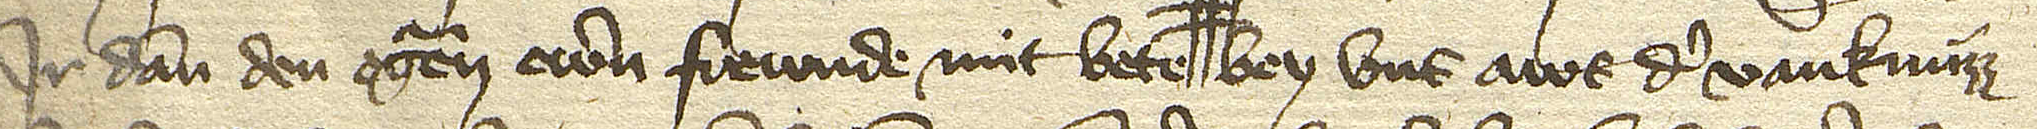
Ir da*n den egen* ew*n frewnde mit bete bey vns aws d* vanknüʒʒ
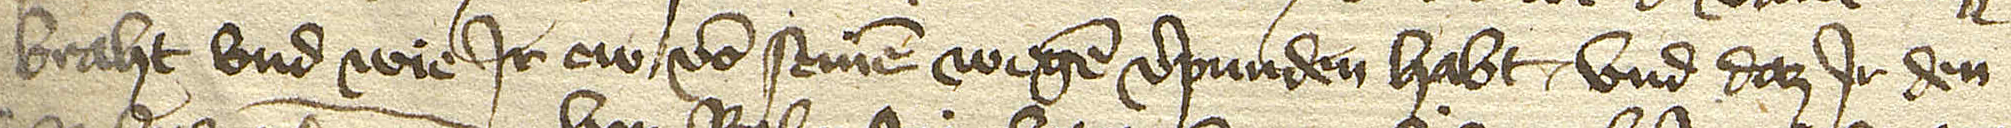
braht vnd wie Ir ew vo* ſeine* wege* v*punden habt / vnd daʒ Ir den
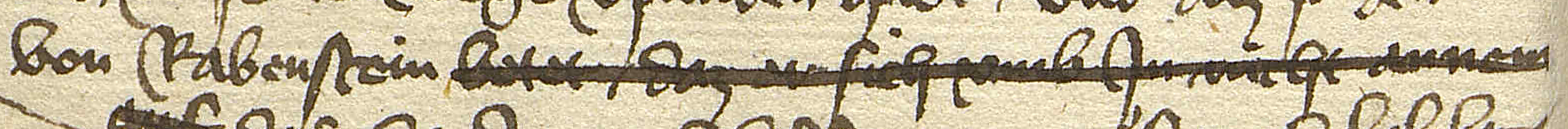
von Rabenſtein betet / das er ſich vmb In nicht annem
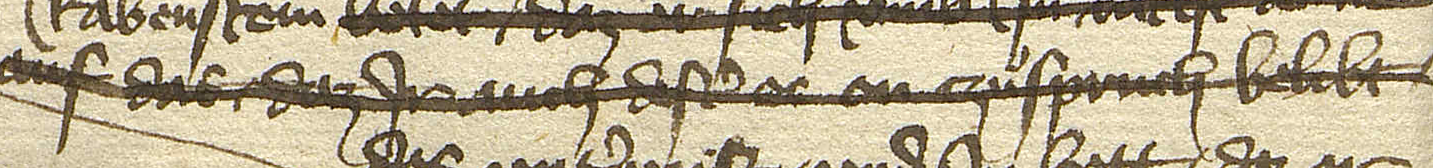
auf das / daʒ Ir auch deſt* er on cʒüſpruch belibt /
